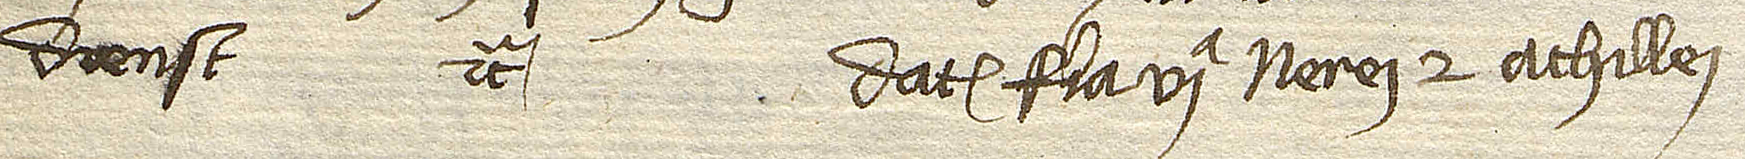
dienst ec* dat* f*ia vi* Nerei @ Achillei
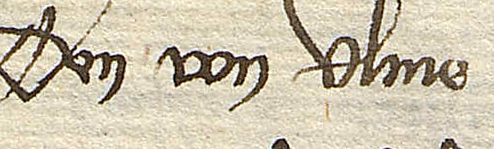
Den von Vlme
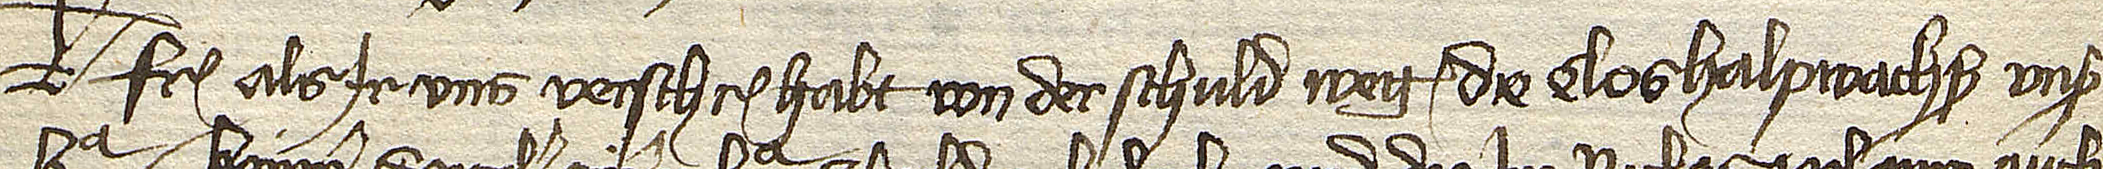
L* fr* als Ir vns verſchr* habt von der ſchuld weg* die Clas halpwachſ* vnſ*
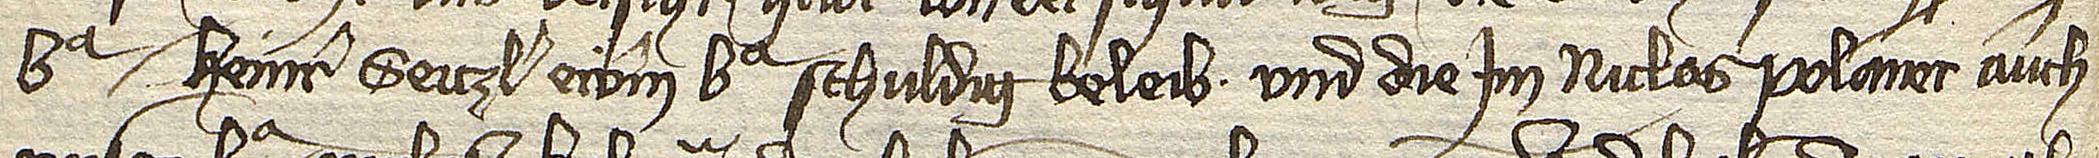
b* / heinr* Seicʒl* ew*m b* ſchuldig beleib . vnd die Im Niclas Polaner auch
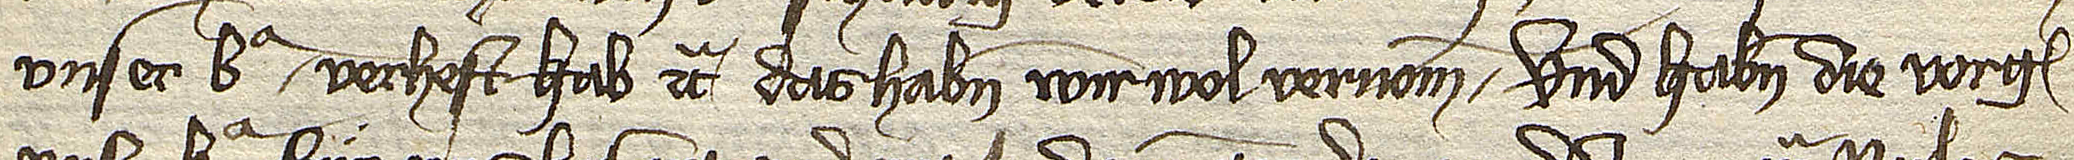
vnſer b* / verheft hab ec* das habn* wir wol vernom* / Vnd habn* die vorg*
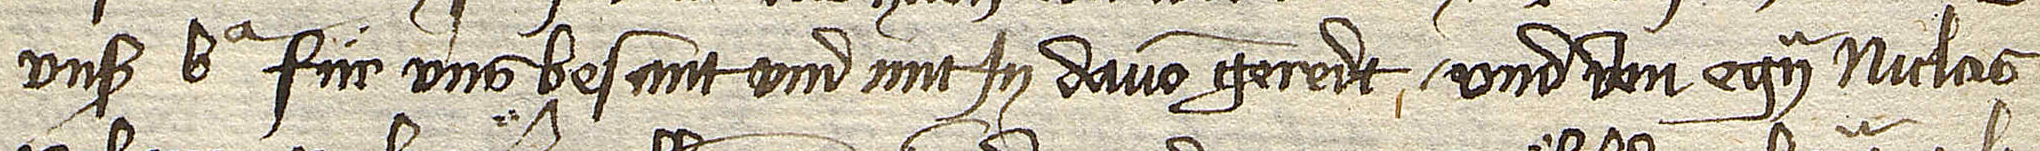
vnſ* b* für vns beſant vnd mit In dauo* geredt / vnd den egn* Niclas
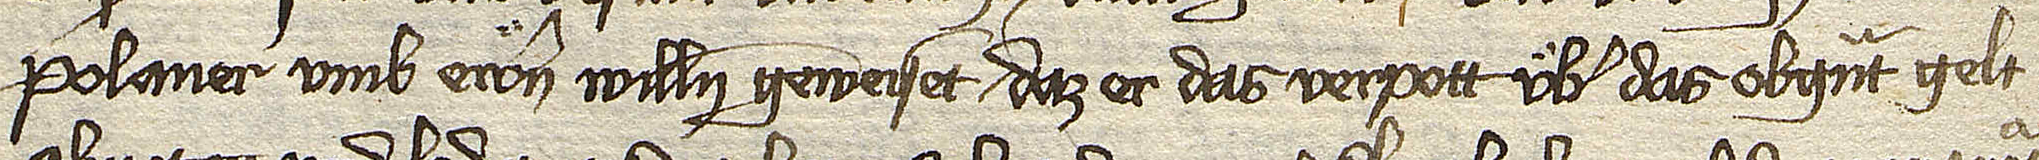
Polaner vmb ew*n willn* geweiſet / daʒ er das verpott v̈b* das obgnt* gelt
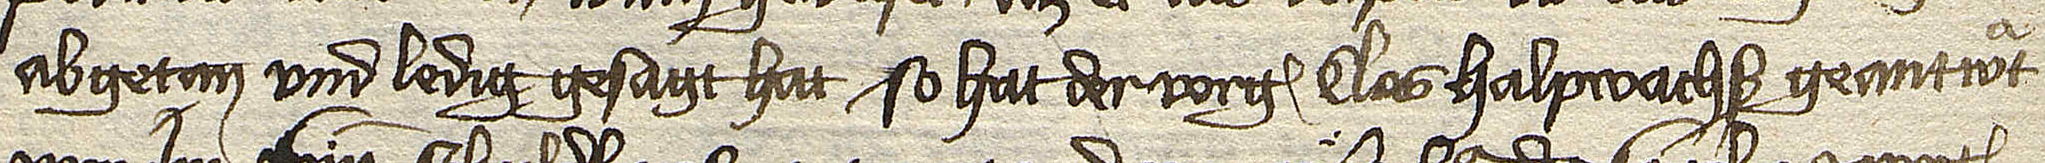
abgetan vnd ledig geſagt hat / ſo hat der vorg* Clas halpwachſ* geantw*t
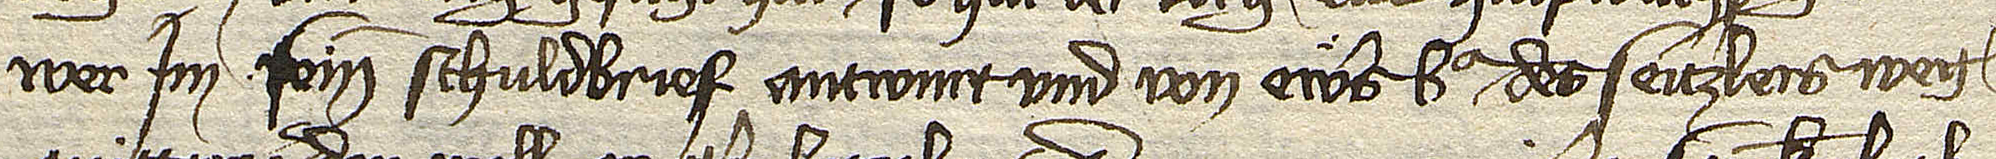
wer Im ſein* ſchuldbrief antwurt vnd von ew*s b* / des ſeicʒlers weg*
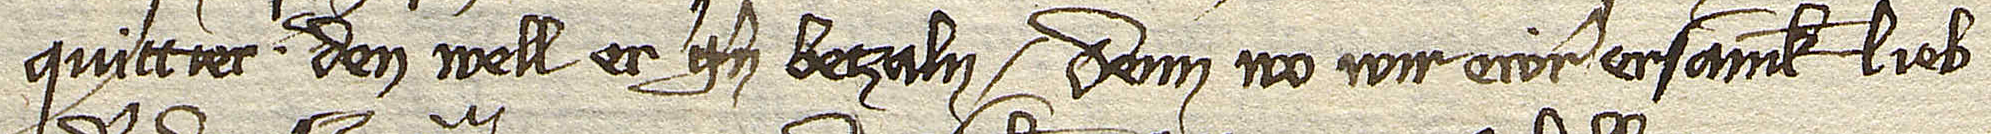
quittrer . den well er g*n becʒaln / Denn wo wir ewr* erſamk* lieb
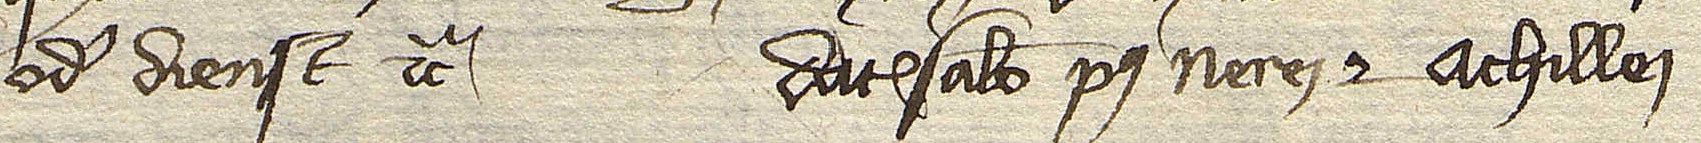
od* dienſt ec* / dat* ſabo* p* Nerei @ Achillei
